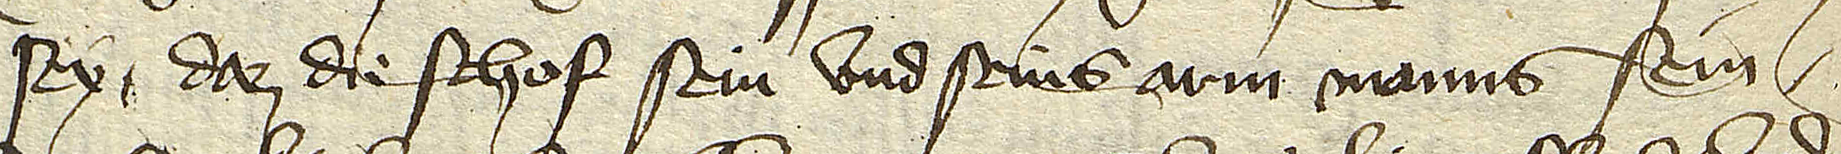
ſey / daʒ die ſchof ſein vnd ſeins arm manns ſein /
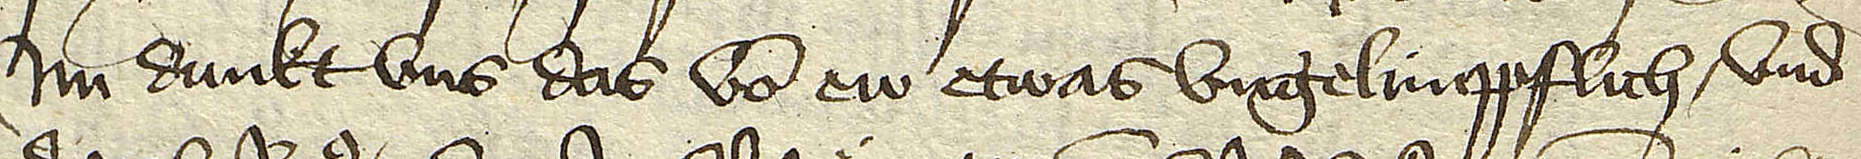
Nu dunkt vns das vo* ew etwas vngelimppflich / vnd
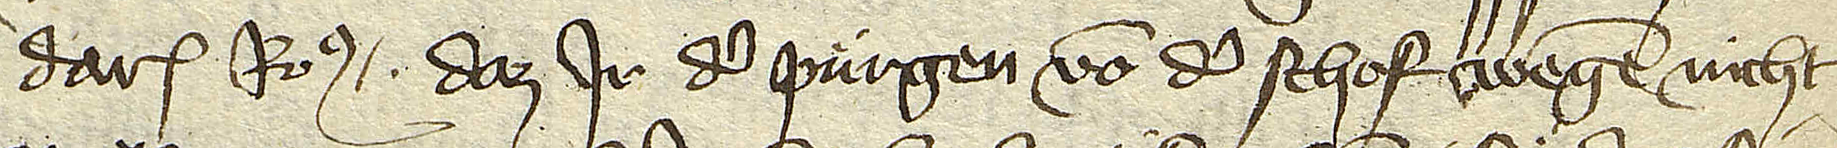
dar* Ro* / . daʒ Ir d* pürgen vo* d* ſchof wege* nicht
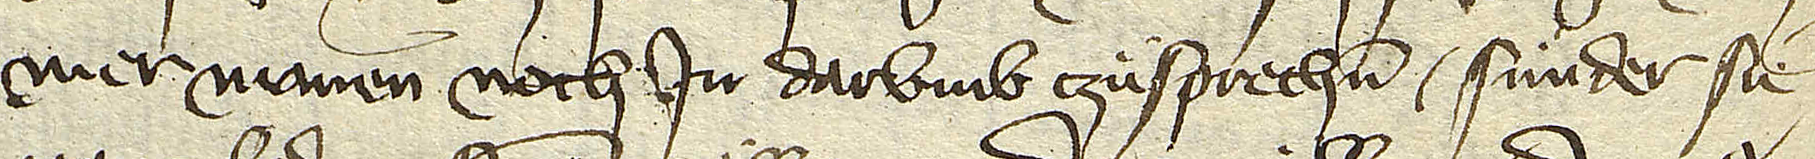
mer manen noch In darvmb cʒüſprechn* / ſünder ſie
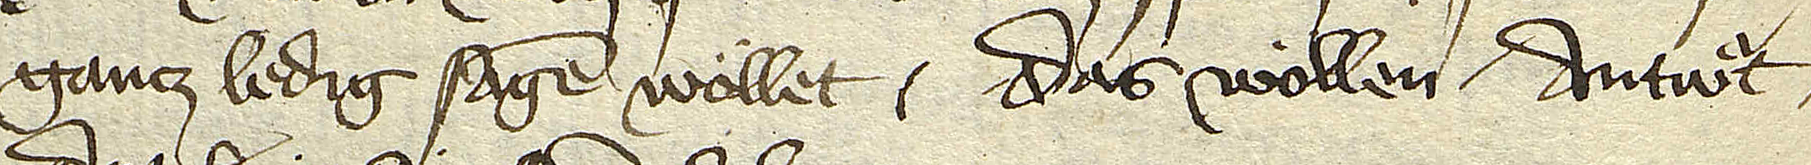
gancʒ ledig ſage* wöllet / Das wöllen / Antwt* /
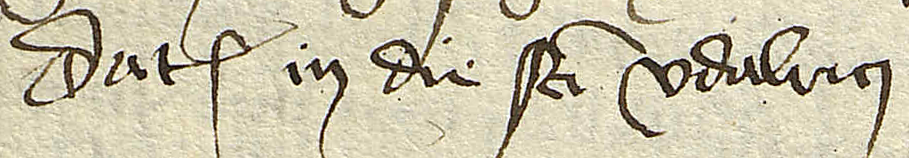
Dat* in die ſci* vdalrici
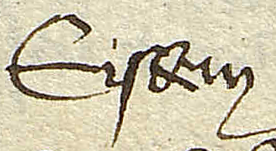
Eiſdem
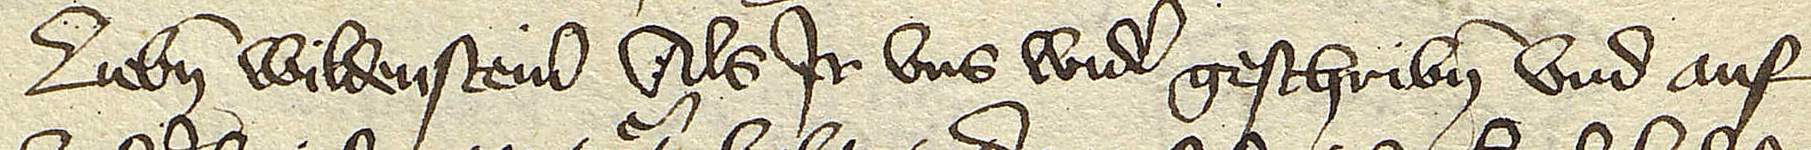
Liebn* wildenſtein* Als Ir vns wid* geſchribn* vnd auf
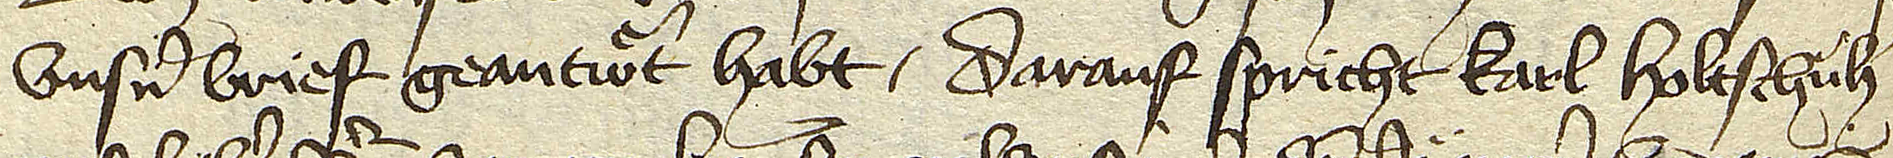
vnſn* brief geantwt* habt / Darauf ſpricht karl holtſchüh*
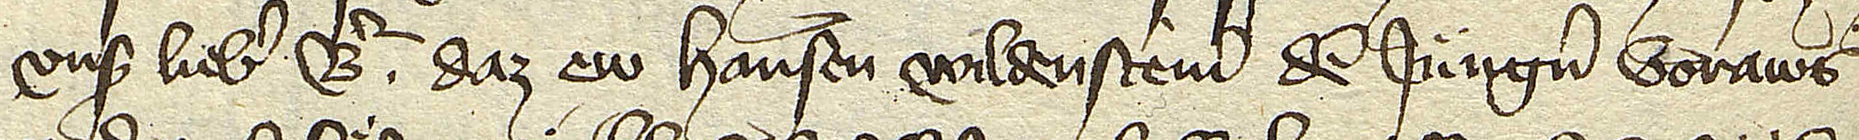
vnſ* lieb* B* . daʒ ew hanſen wildenſtein* d* Iüngn* voraws
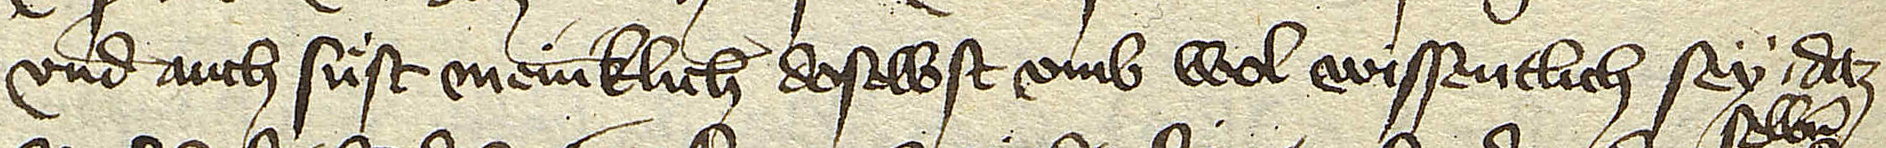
vnd auch ſüſt meniklich doſelbſt vmb wol wiſſentlich ſey / daʒ
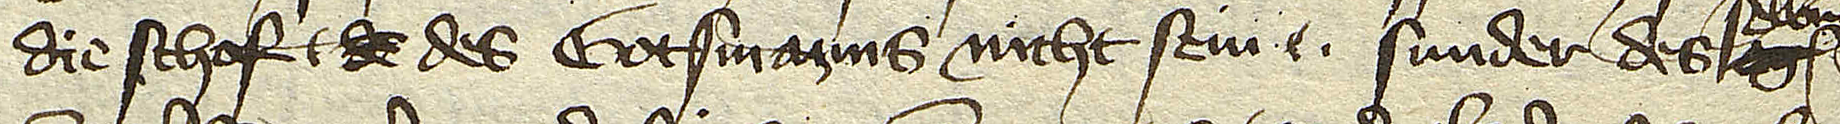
die ſchof / d des Gotſmanns nicht ſein / . ſunder des eg*
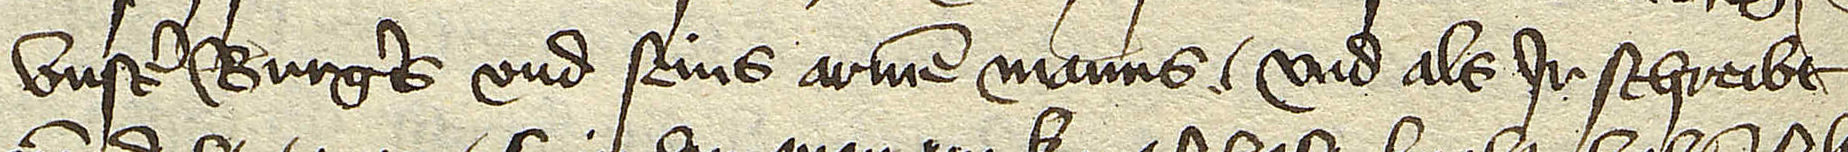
vnſs* Burg*s vnd ſeins arme* manns / vnd als Ir ſchreibt
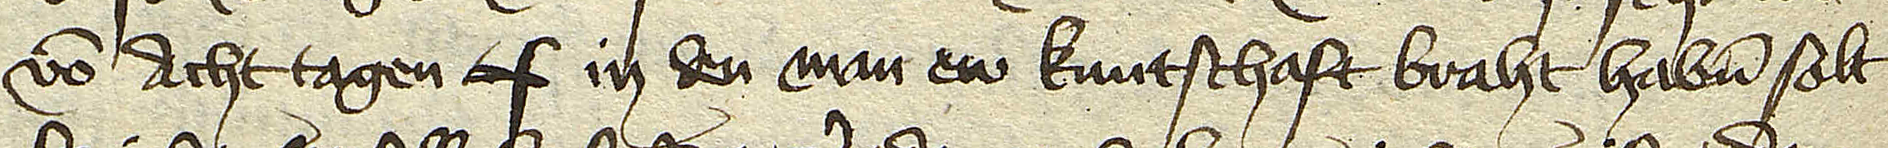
vo* Acht tagen / ſ in den man ew kuntſchaft braht habn* ſolt
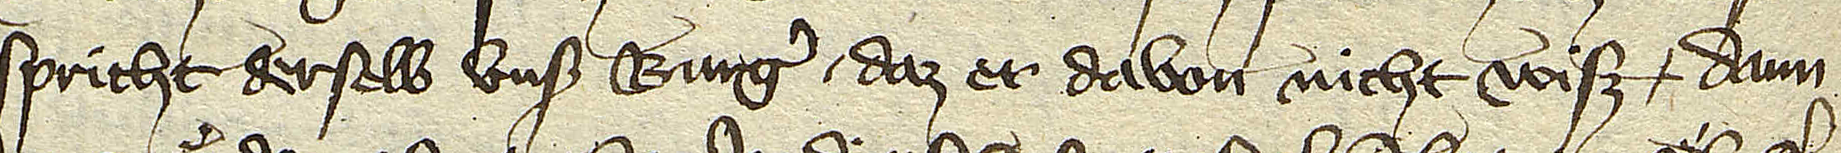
ſpricht derſelb vnſ* Burg* / daʒ er davon nicht wiſʒ / dann
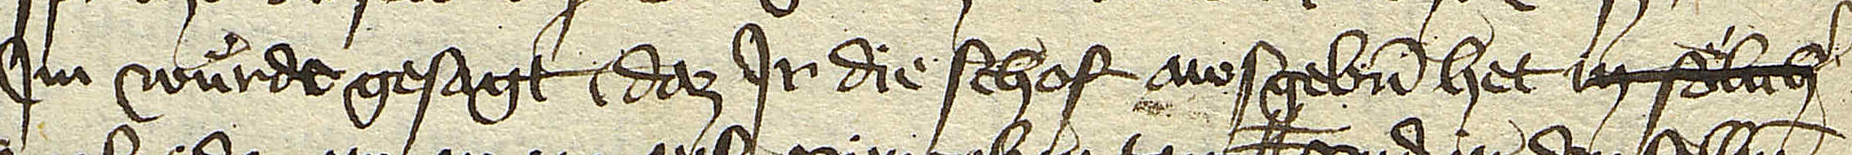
Im würde geſagt / daʒ Ir die ſchof awſgebn* het in ſölich*
